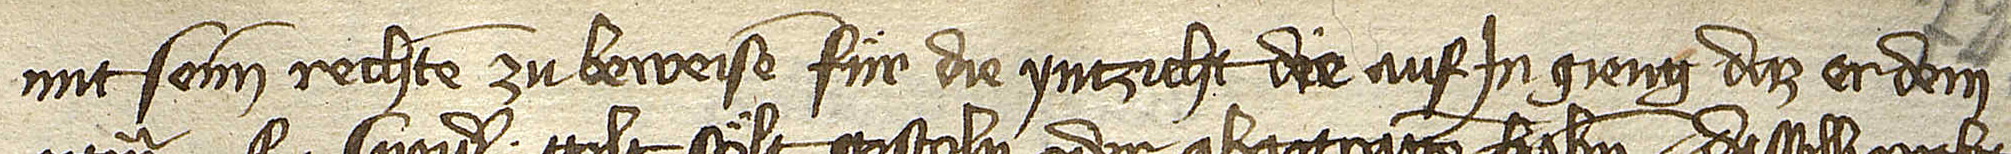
mit ſeim* rechte* ʒu beweiſe* für die yncʒuht die auf In gieng daʒ er dem
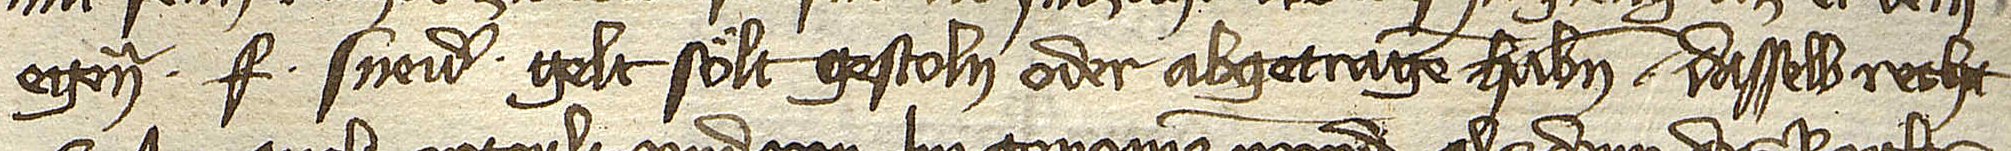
egen* . f . ſneid* gelt ſölt geſtoln oder abgetrage* habn* / Daſſelb recht
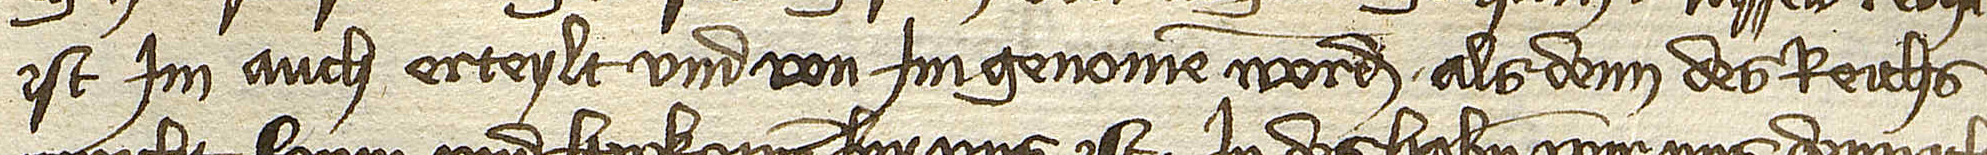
iſt Im auch erteylt vnd von Im genome* word* / als denn des Reichs
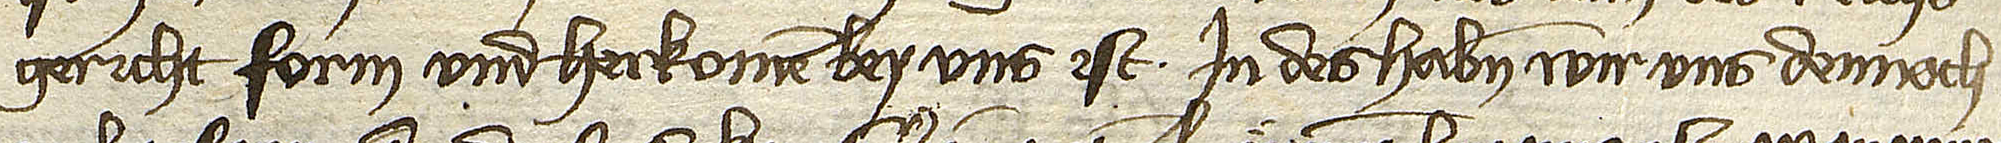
gericht form vnd herkome* bey vns iſt . In des habn* wir vns dennoch
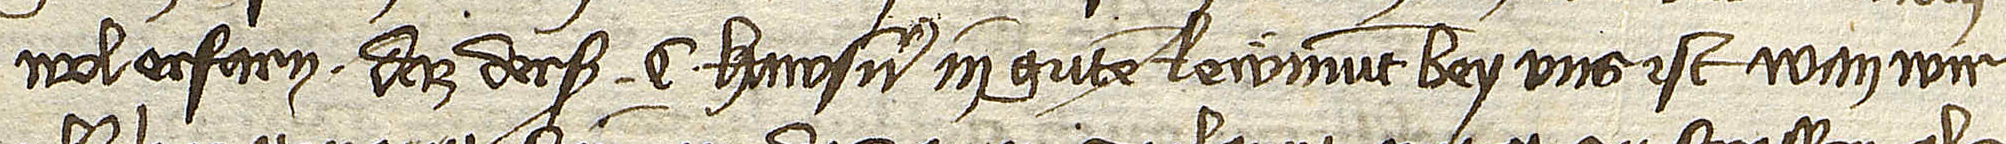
wol erfarn . daʒ derſ* . C . hawſn* in gute* leẅmu*t bey vns iſt wan wir
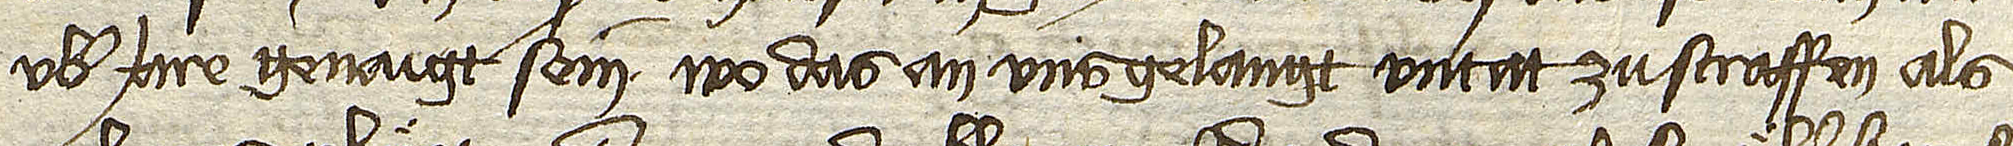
vb* Iare genaigt ſein / wo das an vns gelangt vntat ʒuſtraffen als
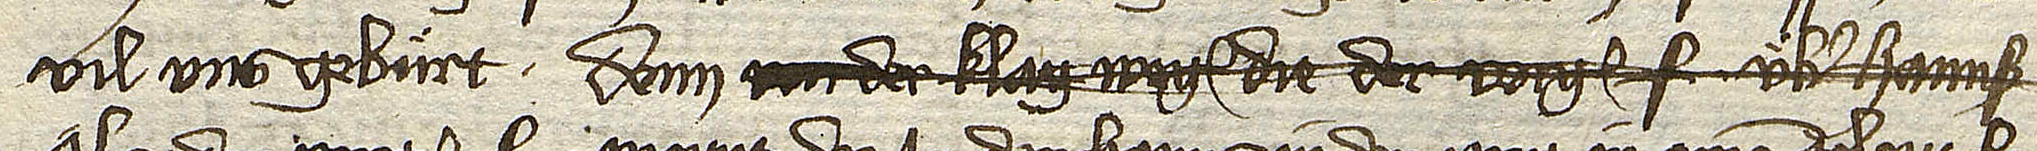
vil vns gebürt / Denn von der klag weg* die der vorg* . f . v̈b* hannſ*
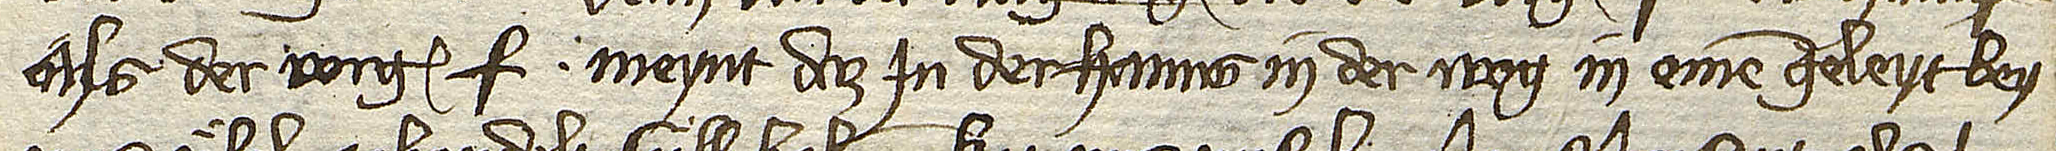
Als der vorg* . f . meynt daʒ In der hanns in der wog in eine* geleyt bey
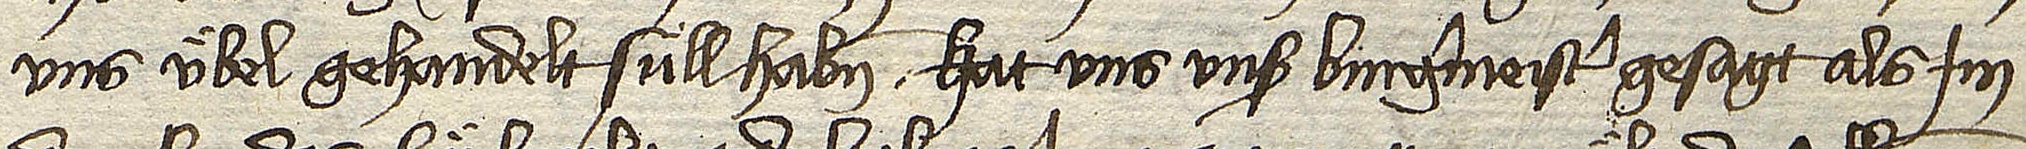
vns v̈bel gehandelt ſüll habn* . hat vns vnſ* burg*meiſt* geſagt als Im
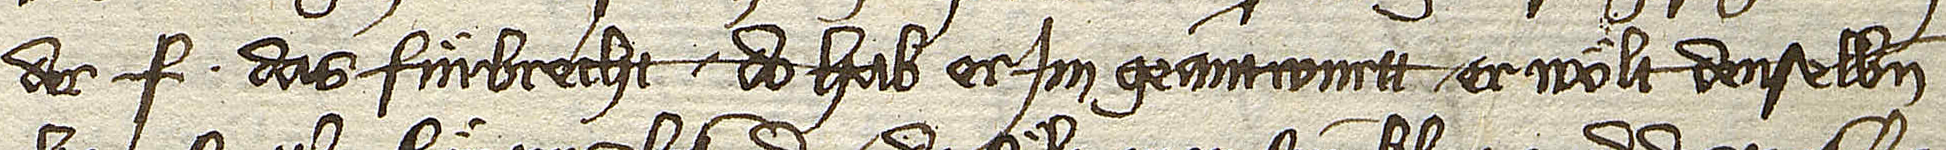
der . f . das fürbrecht / do hab er Im geantwurtt / er wölt denſelbn*
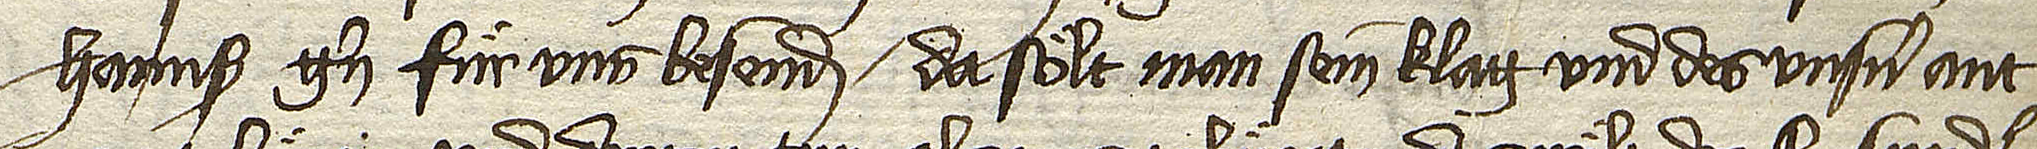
hannſ* g*n für vns beſend* / da ſölt man ſein klag vnd des vnſn* ant
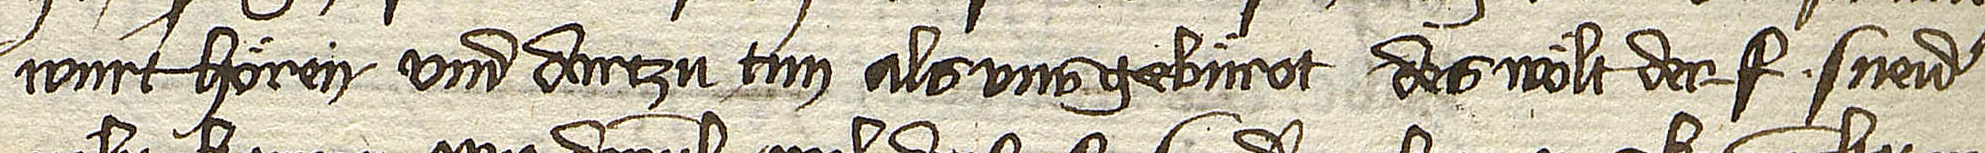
wurt hören / vnd darcʒu tun als vns gebüret / des wölt der . f . ſneid*
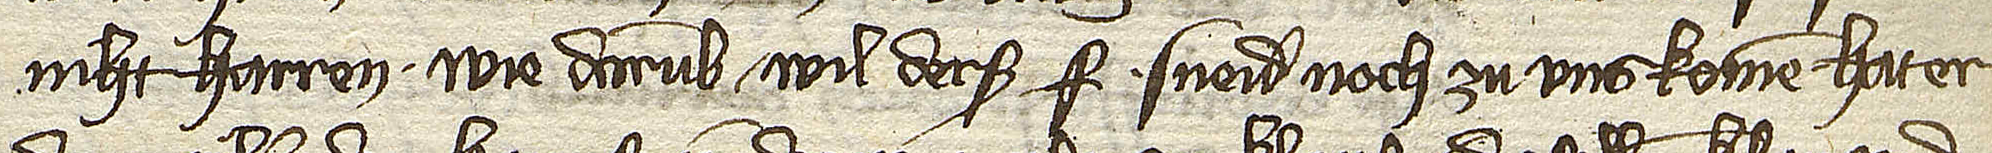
niht harren / wie darub* / wil derſ* . f . ſneid* noch ʒu vns kome* hat er
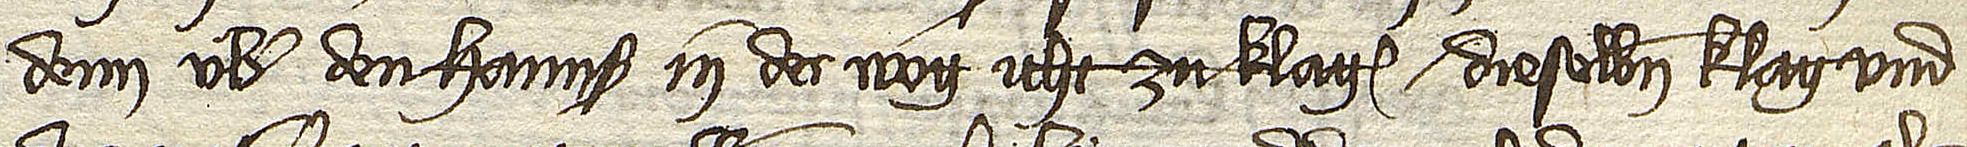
denn v̈b* den hannſ* in der wog icht ʒu klag* / dieſelbn* klag vnd
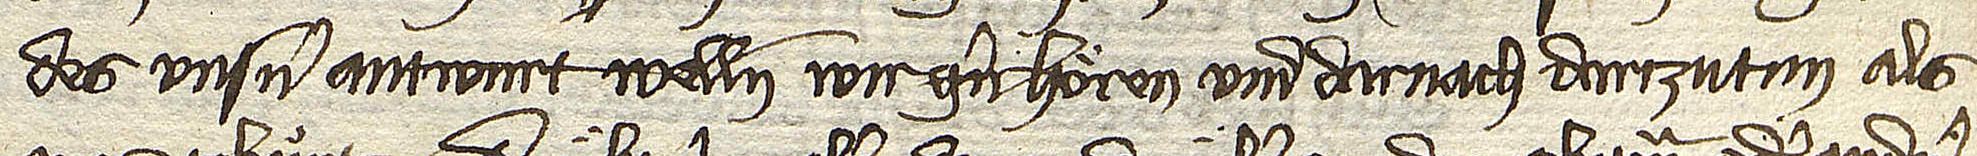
des vnſn* antwurt welln* wir g*n hören vnd darnach darcʒutun als
